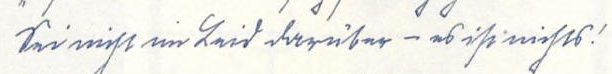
Sei nicht im Leid darüber-es ist Nichts!
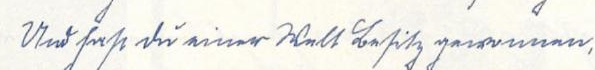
Und hast du einer Welt Besitz gewonnen,
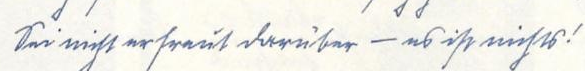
Sei nicht erfreut darüber-es ist nicht Nichts!
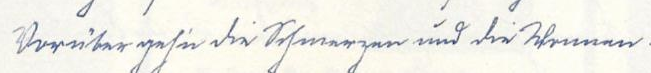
Vorüber gehen die Schmerzen und die Wennen …
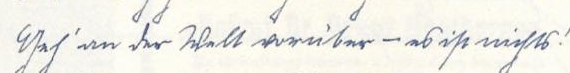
Geht an der Welt vorüber – es ist Nichts!
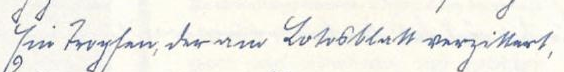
Ein Tropfen, der am Lotusblatt erzittert,
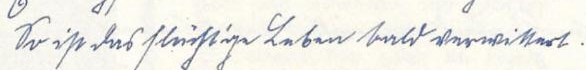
So ist das flüchtige Leben bald verzittert…!
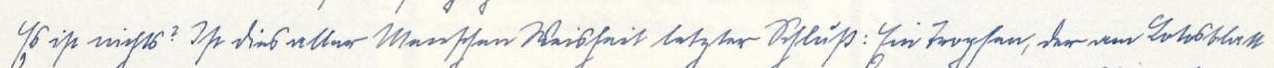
Es ist nichts? Ist dies aller Menschen Weisheit letzter Schluß: ein Tropfen, der am Lotusblatt
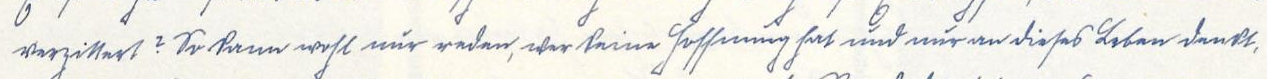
verzittert? So kann wohl nur reden, wer keine Hoffnung hat und nur an dieses Leben denkt,
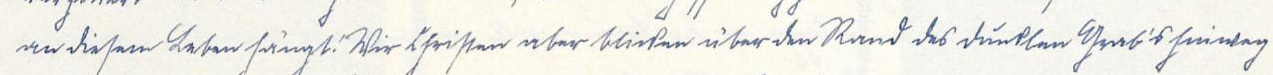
an diesem Leben hängt. Wir Christen aber blicken über den Rand des dunklen Grab‘s hinweg
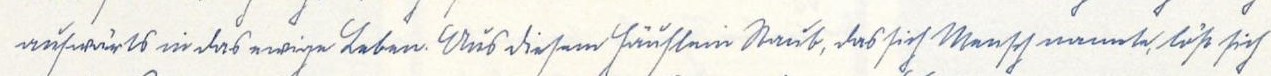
aufwärts in das ewige Leben. Aus diesem Häuflein Staub, das sich Mensch nannte, löst sich
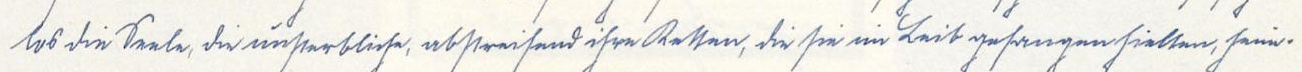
los die Seele, die unsterbliche, abstreifend ihre Ketten, die sie im Leid gefangen hielten, heim-
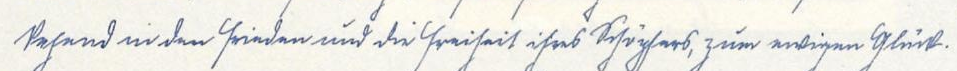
kehrend in den Frieden und die Freiheit ihres Schöpfers zum ewigen Glück…
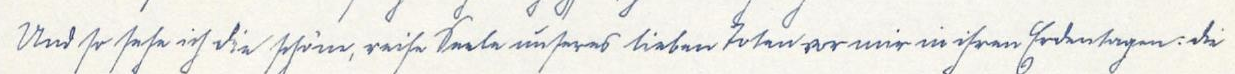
Und so sehe ich die schöne, reife Seele unseres lieben Toten vor mir in ihren Erdentagen: die
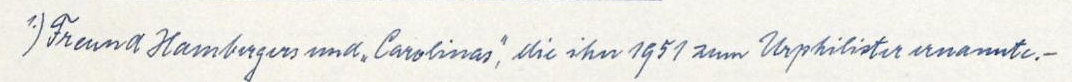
1) Freund Hambergers und „Carolinas“, die ihn 1951 zum Urphilister ernannte. –
